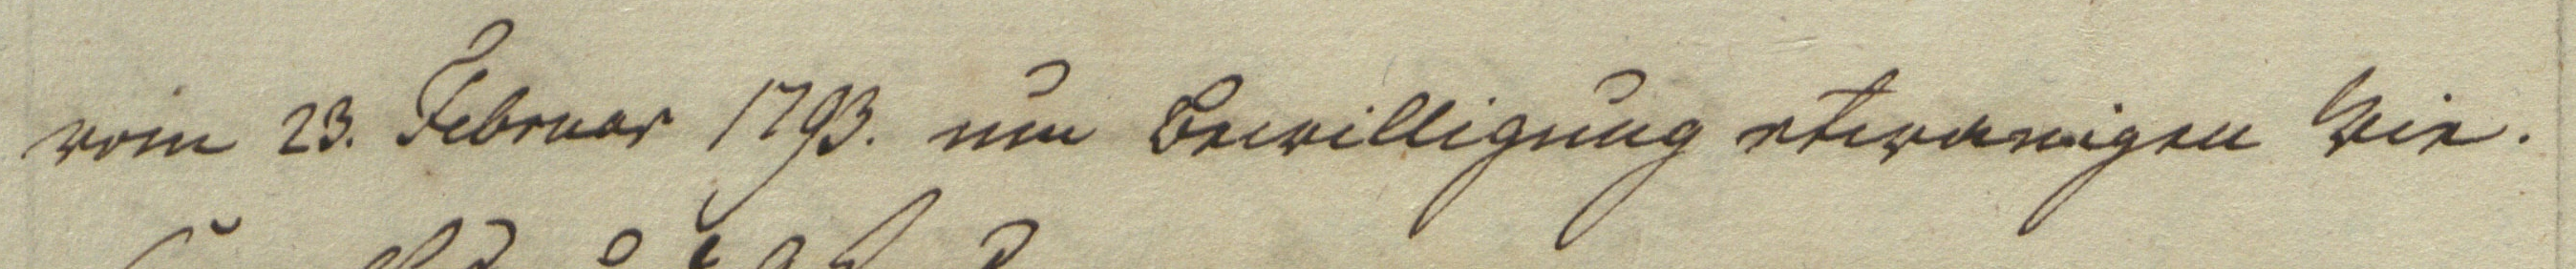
vom 23. Februar 1793. um Bewilligung etwanigen Wie¬
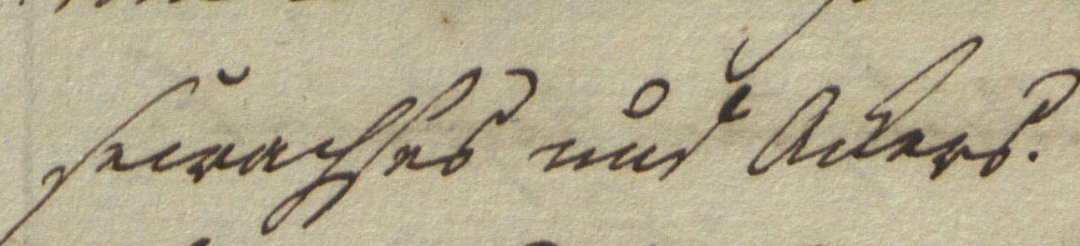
sewachses und Ackers.
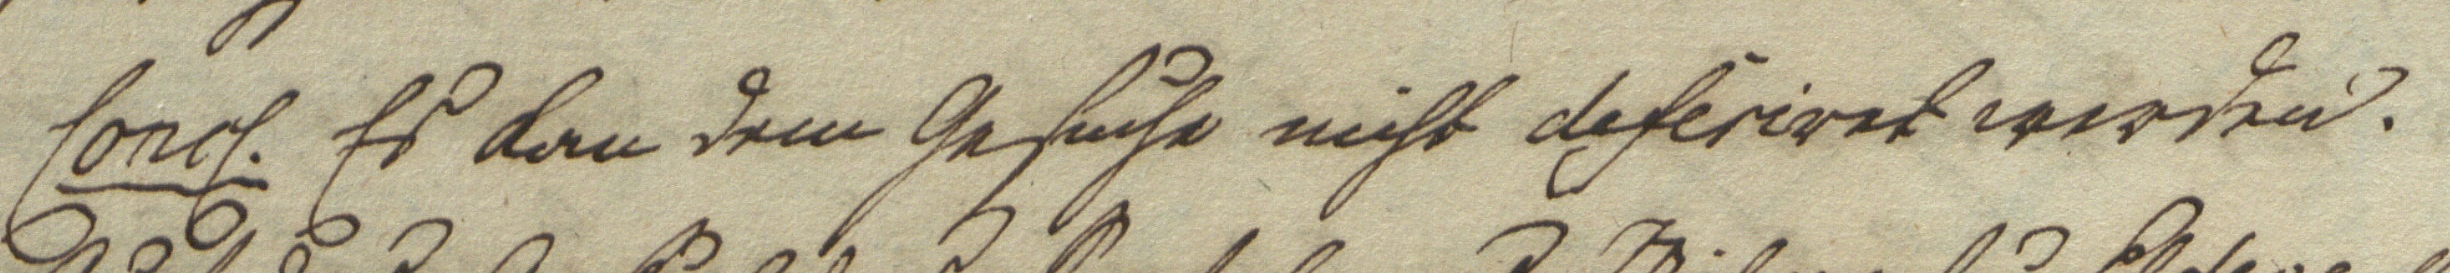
Concl. Es kan dem Gesuche nicht deferiret werden.
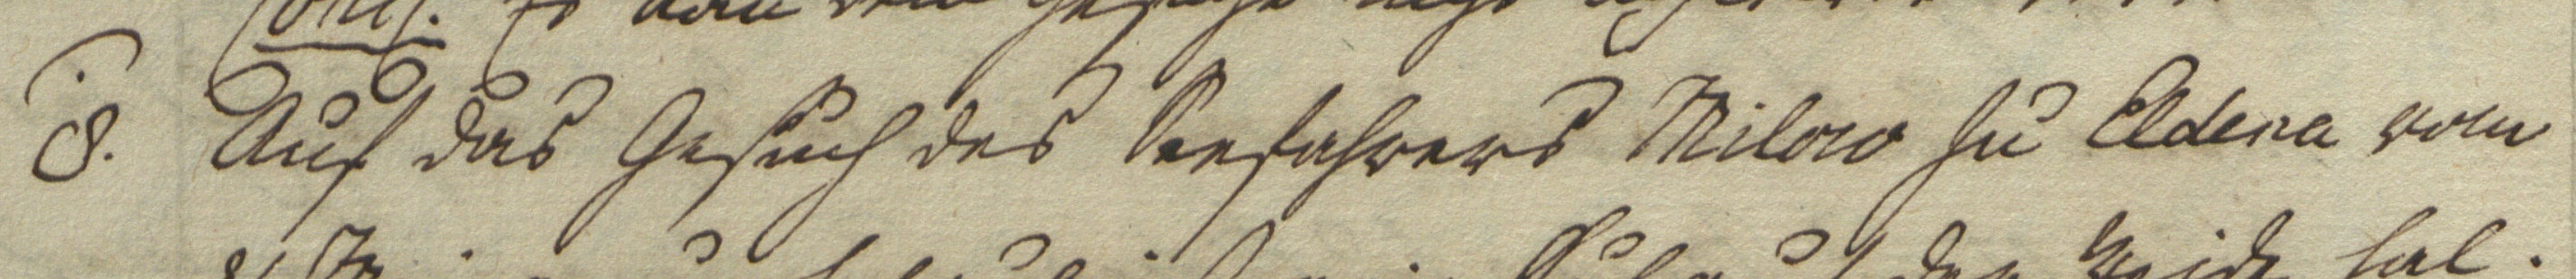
8. Auf das Gesuch des Seefahrers Milow zu Eldena vom
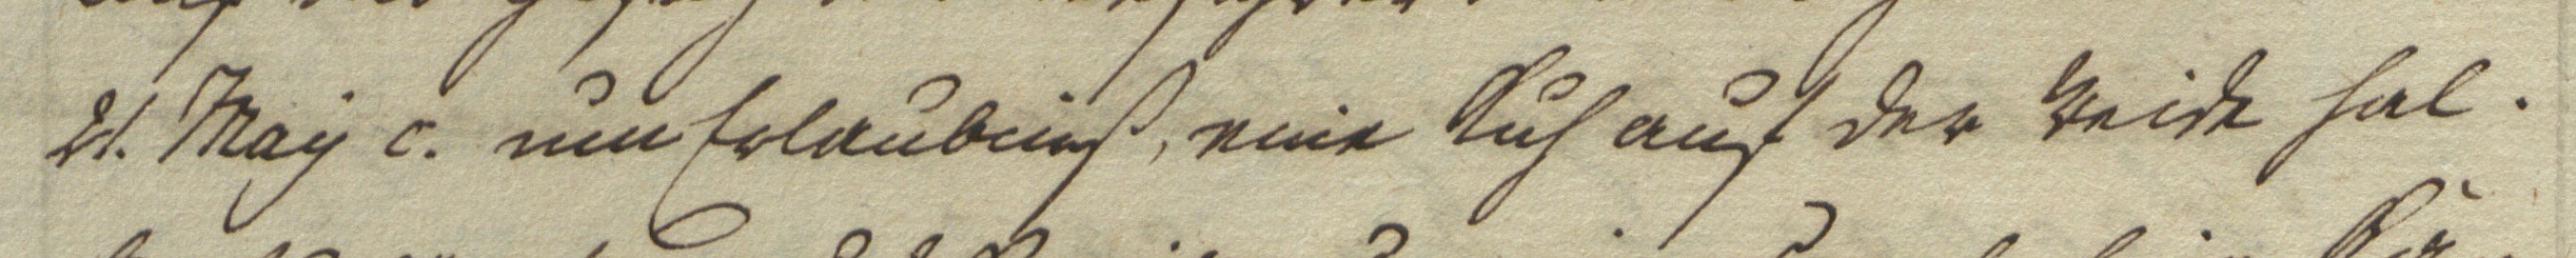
2. Maÿ c. um Erlaubniß, eine Kuh auf der Weide hal¬
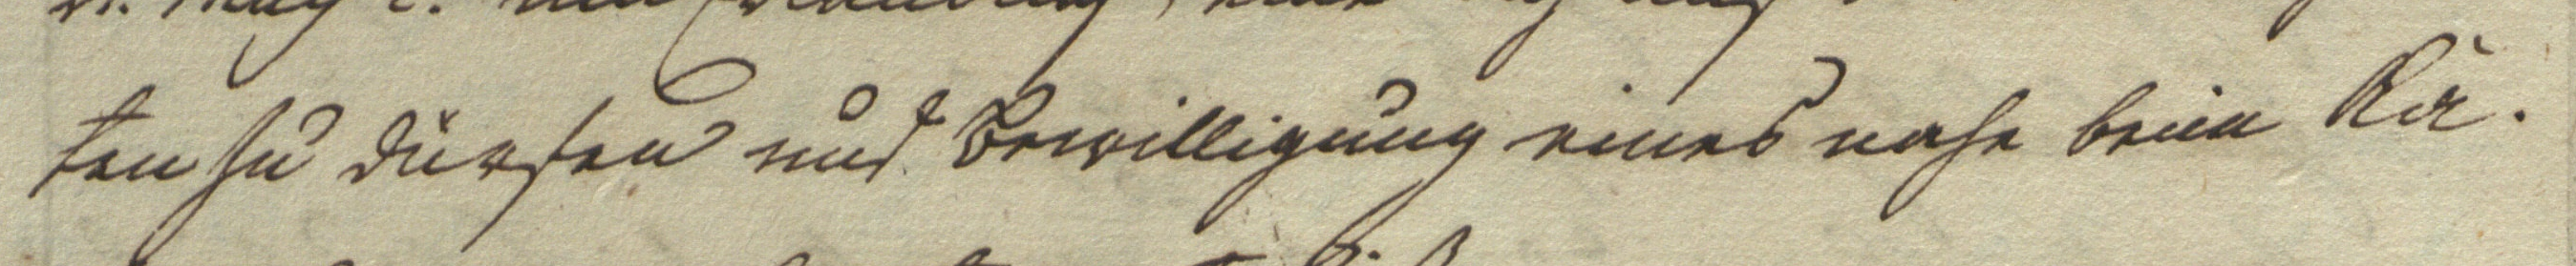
ten zu dürfen und Bewilligung eines nahe beim Ka¬
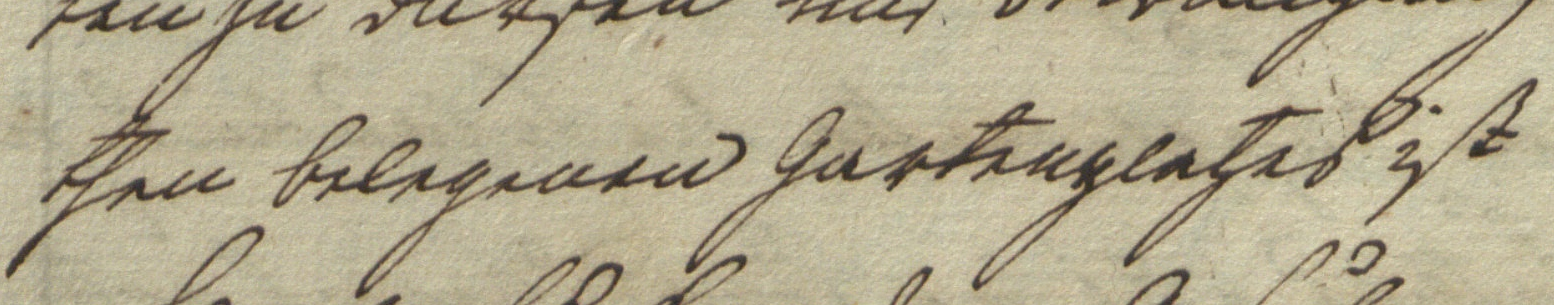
then belegenen Gartenplatzes ist
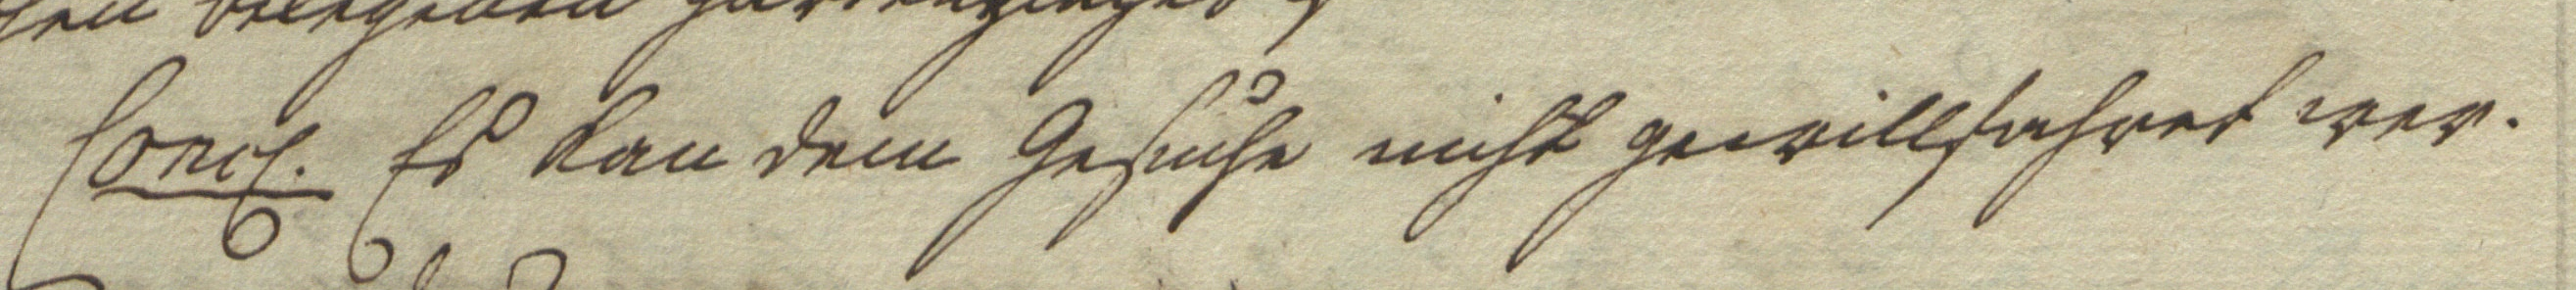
Concl. Es kan dem Gesuche nicht gewillfahret wer¬
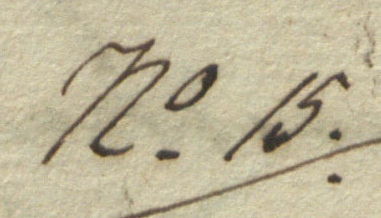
No 15.
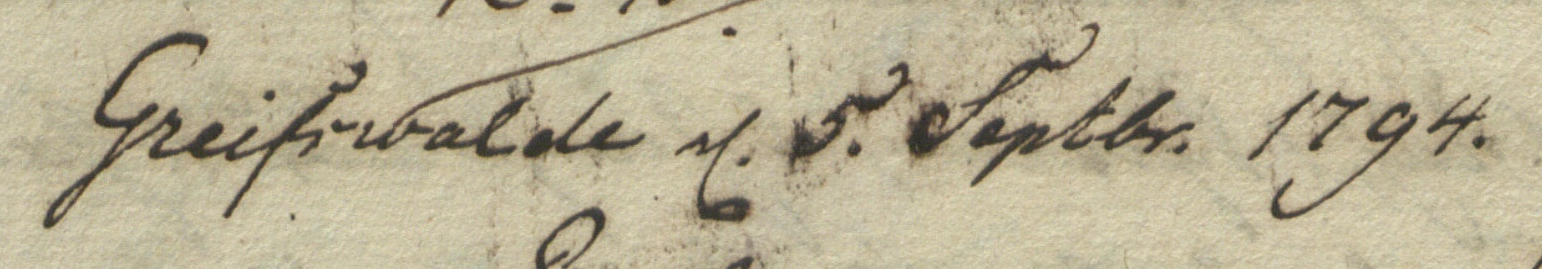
Greifswalde d. 5. Septbr. 1794.
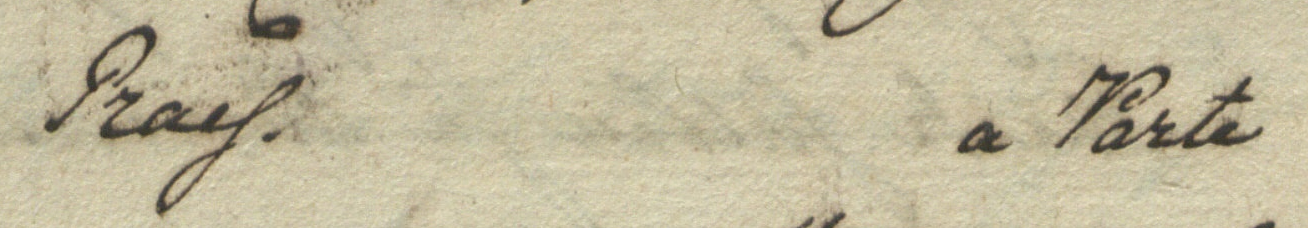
Praes. a Parte
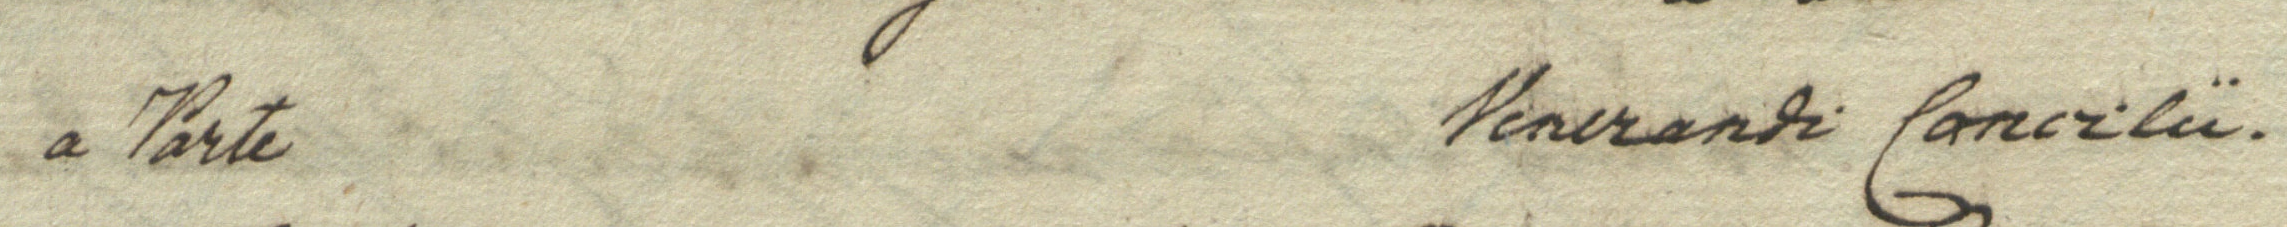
a Parte Venerandi Concilii.
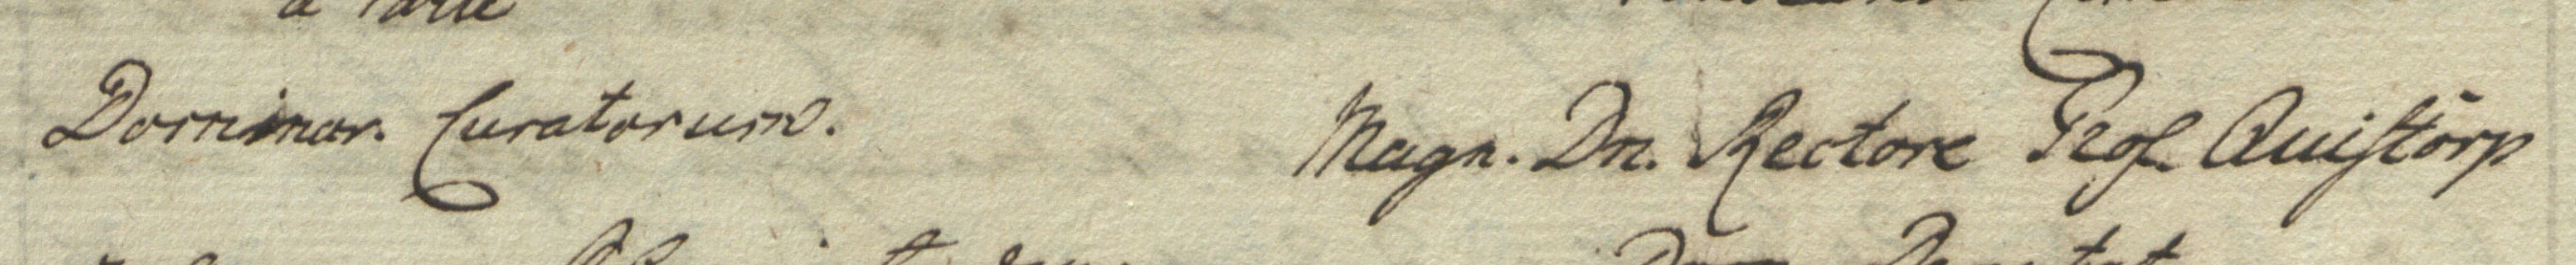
Domnor. Curatorum Magn. Dn. Rectore Prof. Quistorp
